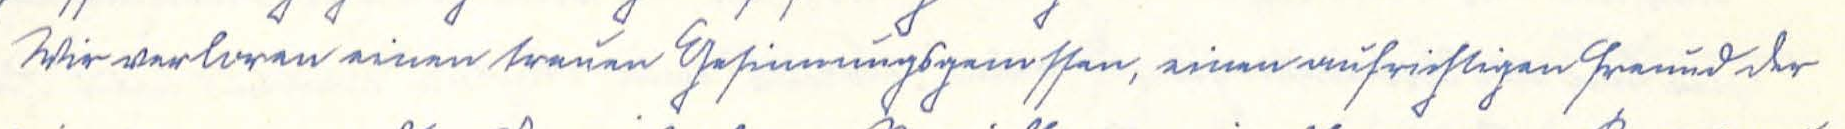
Wir verloren einen treuen Gesinnungsgenossen, einen aufrichtigen Freund der
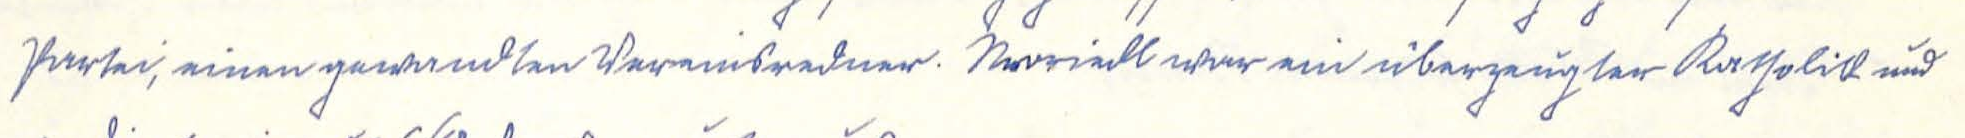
Parte, einen gewandten Vereinsredner. Stroriedl war ein überzeugter Katholik und
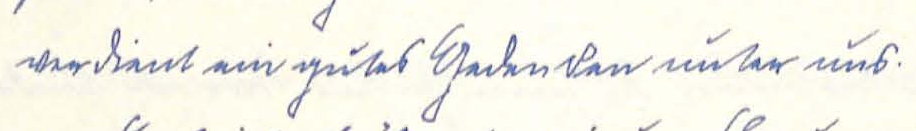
verdient ein gutes Gedenken unter uns.
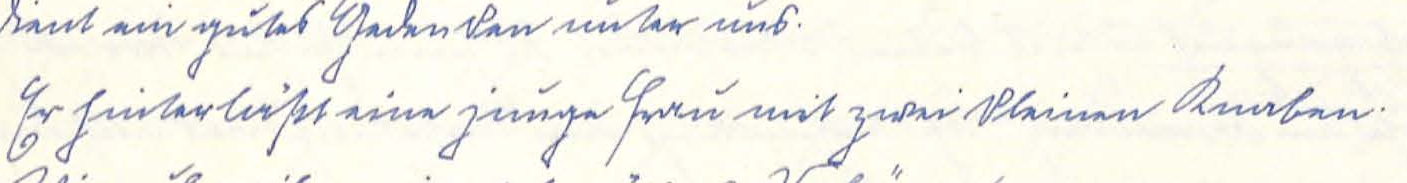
Er hinterlässt eine junge Frau mit zwei kleinen Knaben
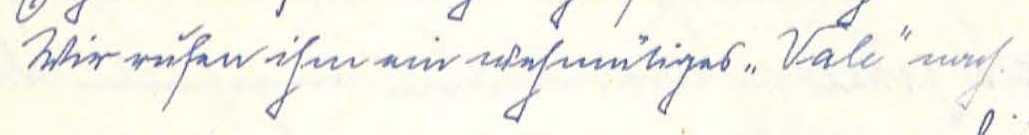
Wir rufen ihm ein wehmütiges „Vale“ nach
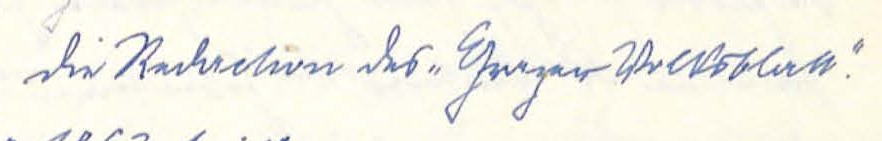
die Redaction des Grazer Volksblatt".
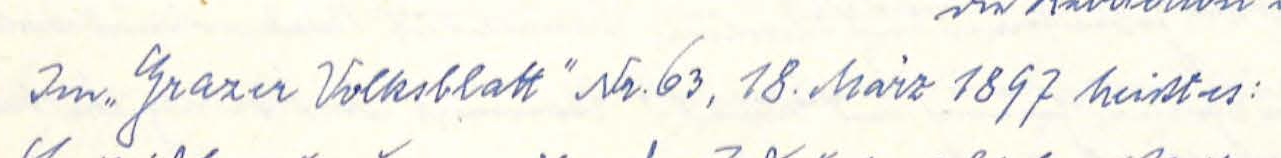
Im "Grazer Volksblatt" Nr. 63, 18. März 1897 heißt es:
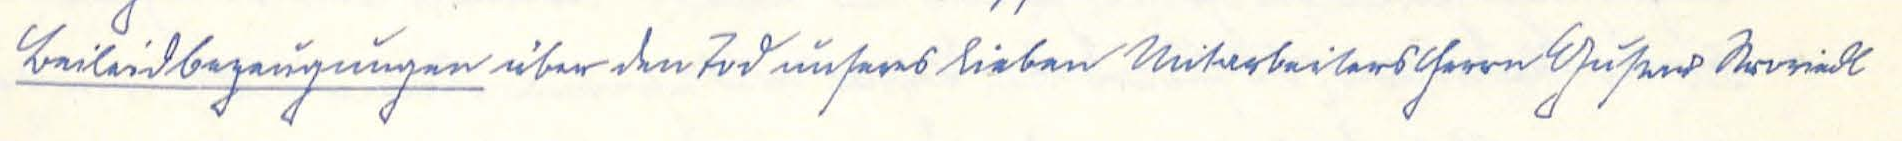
Beileidbezeugungen über den Tod unseres lieben Mitarbeiters Herrn Gustav Stroriedl
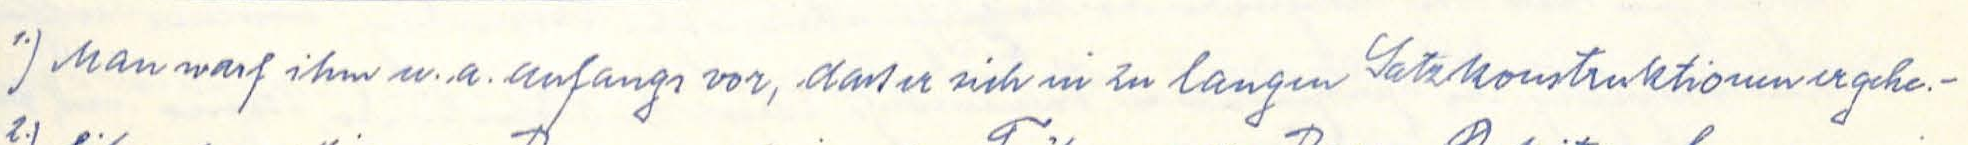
1.) Man warf ihm u.a. anfangs vor, daß er sich in zu langen Satzkonstruktionen ergehe.-
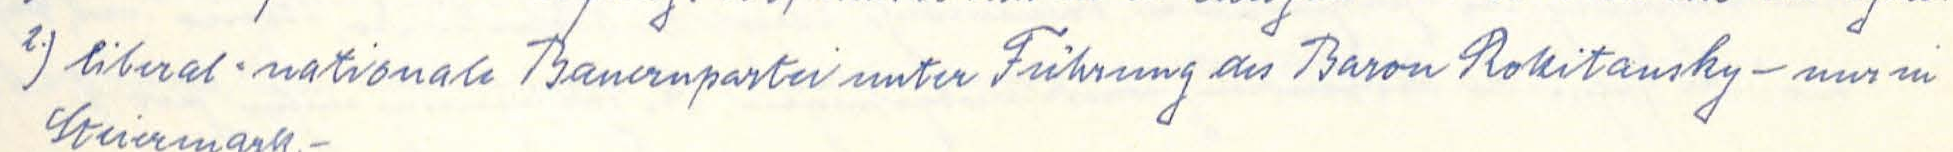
2.) liberal-nationale Bauernpartei unter Führung des Baron Rokitausky - nur in
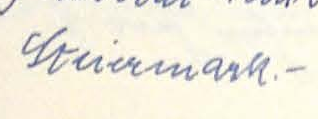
Steiermark.-
